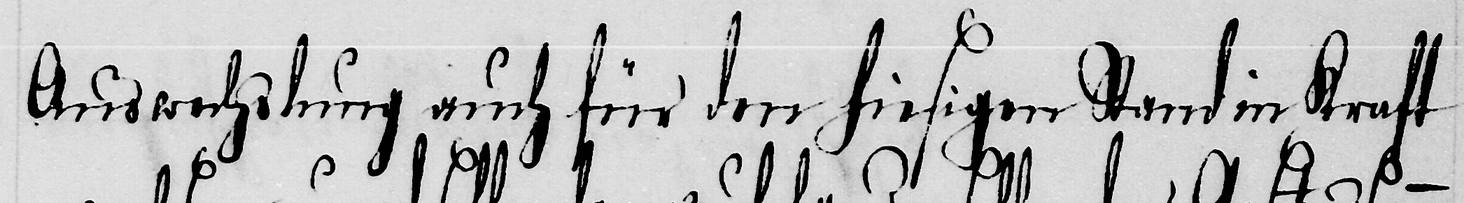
Auswechslung auch für den hiesigen Stand in Kraft
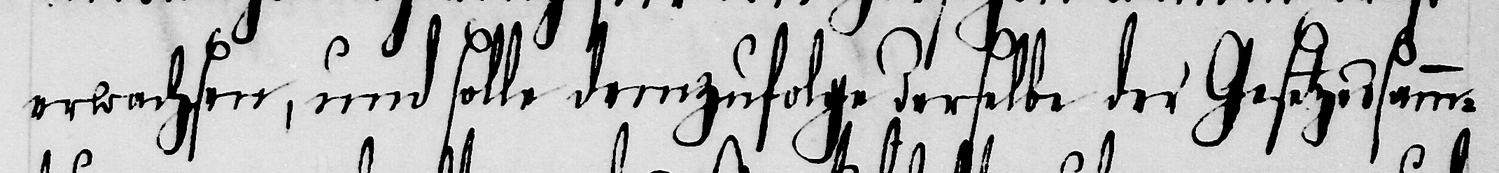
erwachsen, und solle demzufolge derselbe der Gesetzessam¬
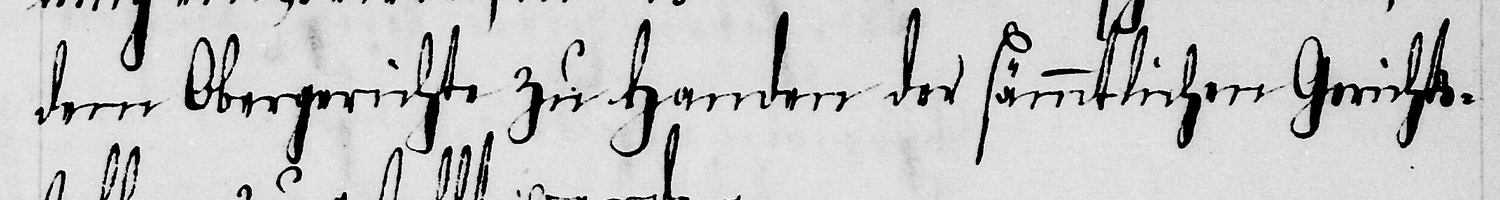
dem Obergerichte zu Handen der sämmtlichen Gerichts¬
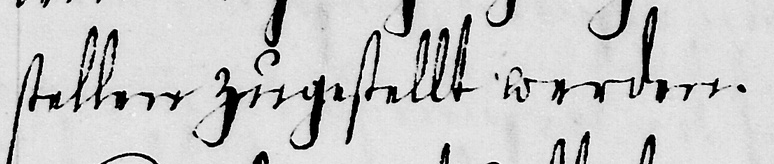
stellen zugestellt werden.
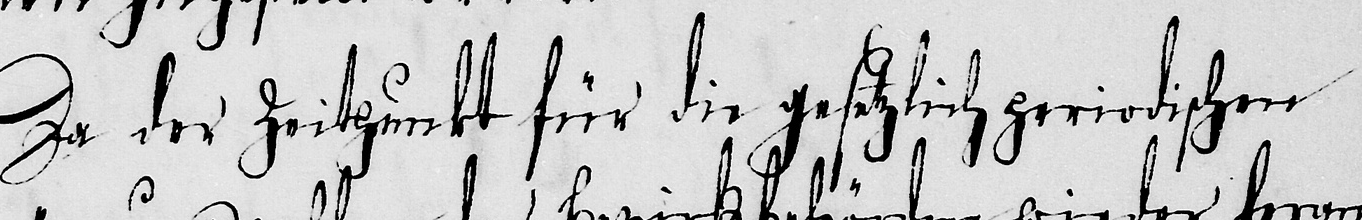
Da der Zeitpunkt für die gesetzlich periodischen
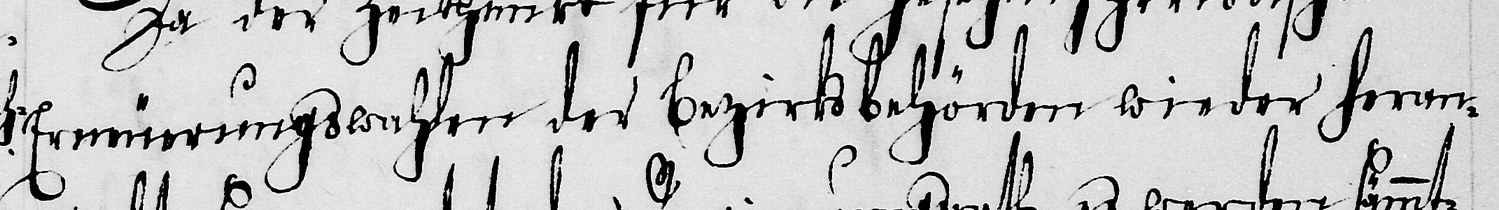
Erneuerungswahlen der Bezirksbehörden wieder heran¬
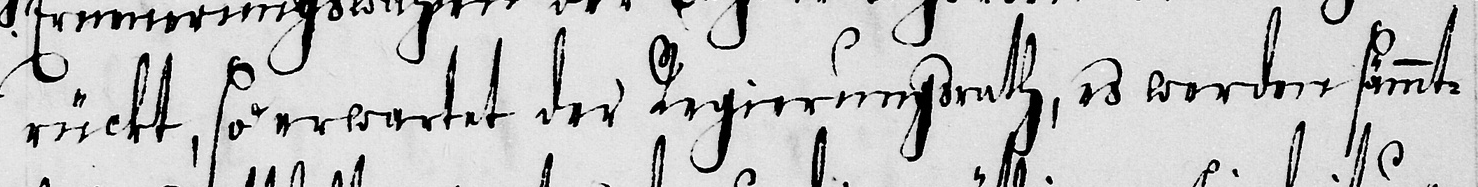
rückt, so erwartet der Regierungsrath, es werden sämmt¬
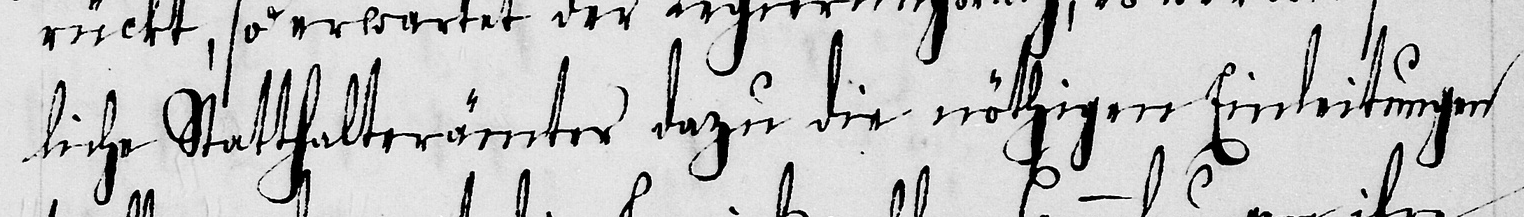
liche Statthalterämter dazu die nöthigen Einleitungen
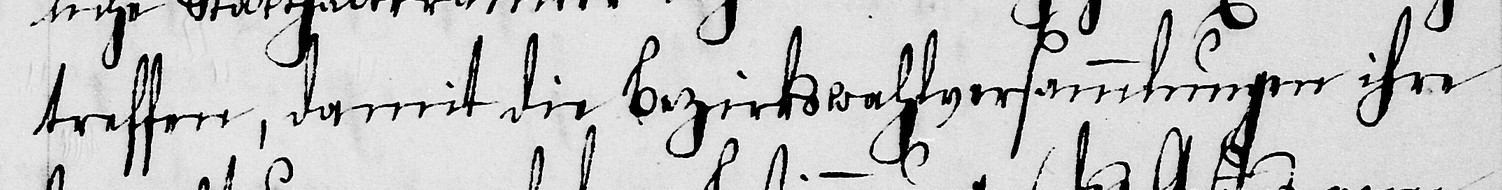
treffen, damit die Bezirkswahlversammlungen ihre
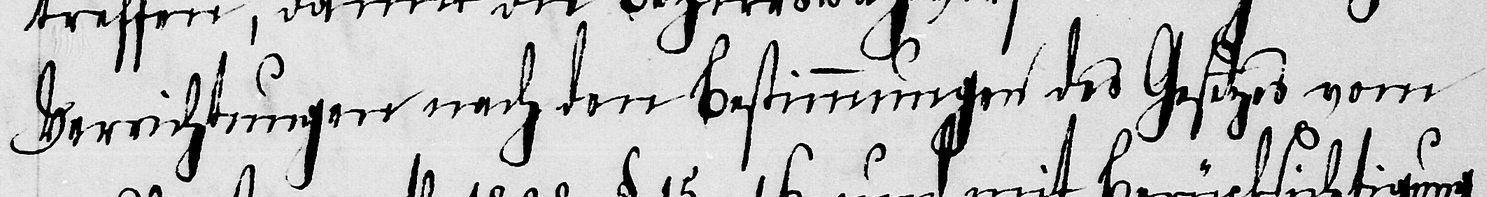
Verrichtungen nach den Bestimmungen des Gesetzes vom
